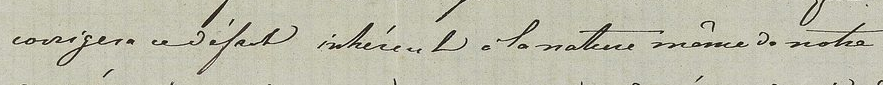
corrigera ce défaut inhérent à la nature même de notre
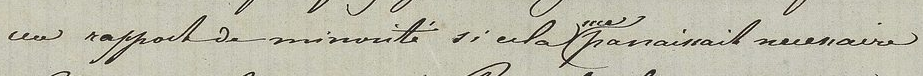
un rapport de minorité si cela me parraissait necessaire.
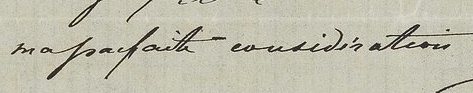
ma parfaite considération
